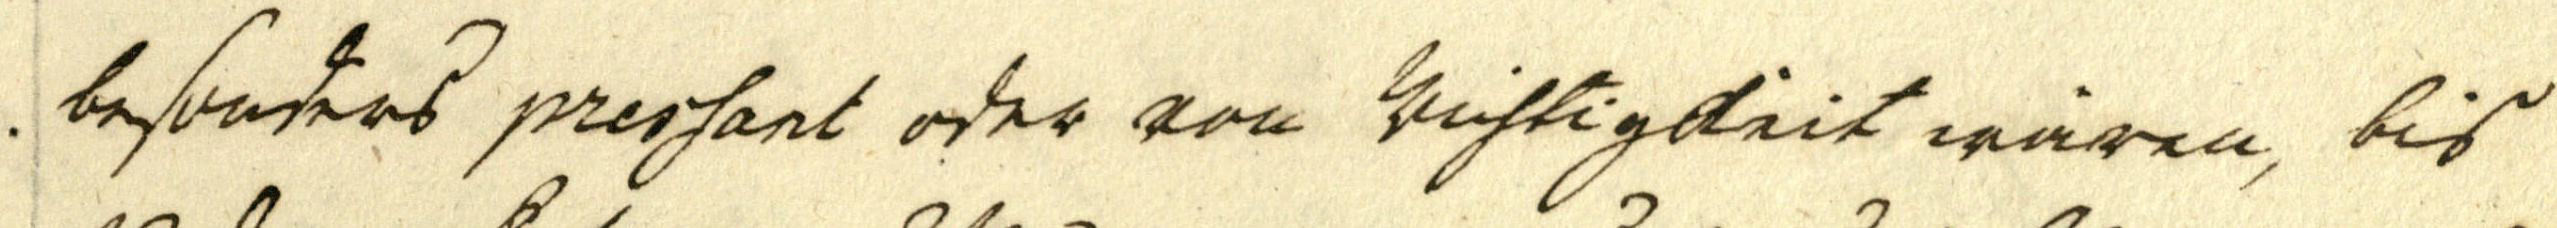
besonders pressant oder von Wichtigkeit wären, bis
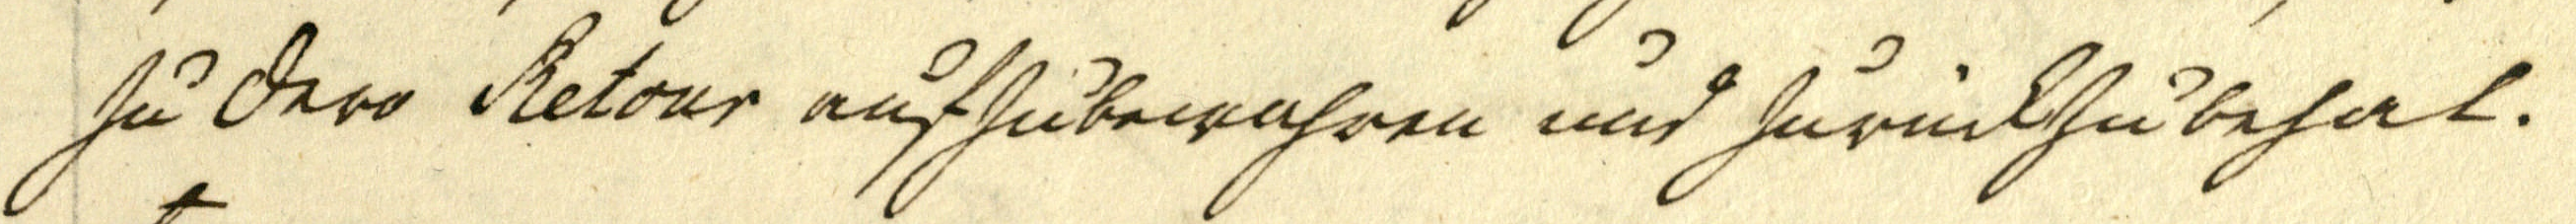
zu Dero Retour aufzubewahren und zurückzubehal¬
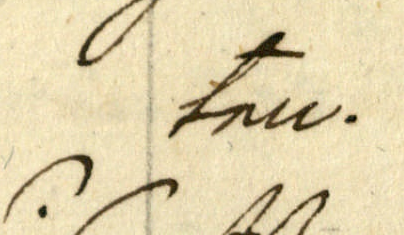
ten.
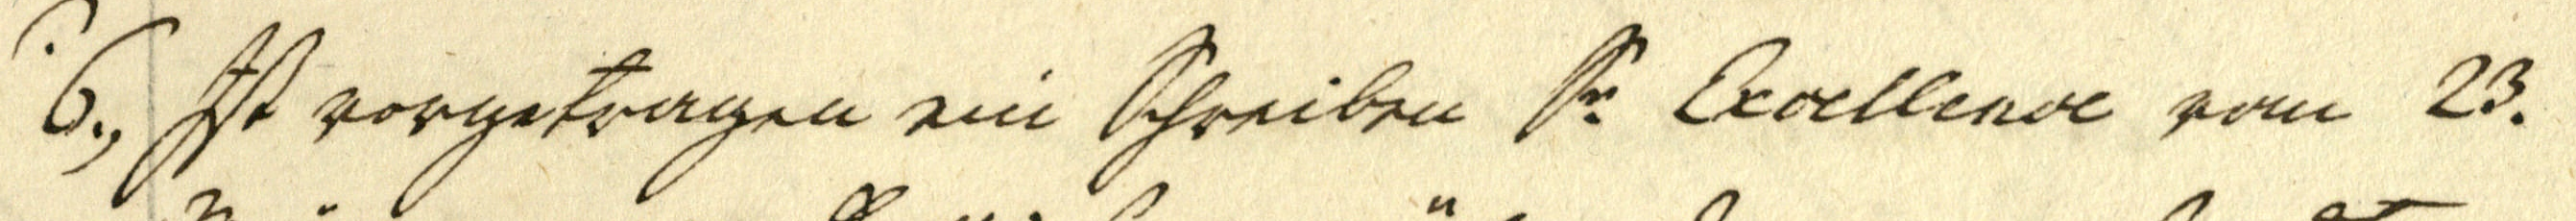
6., Ist vorgetragen ein Schreiben Sr. Excellence vom 23.
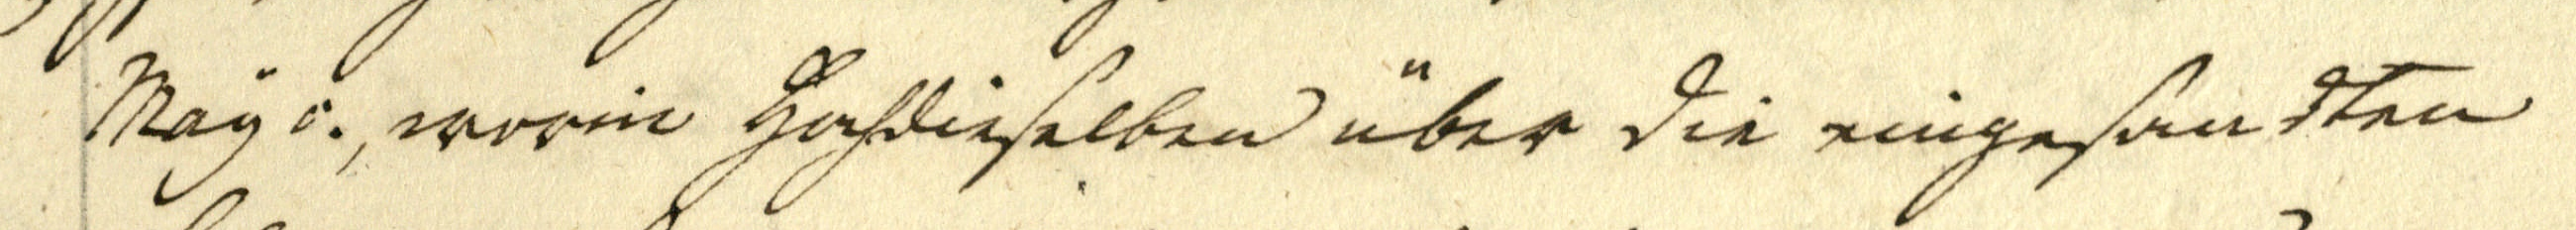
Maÿ c. worin Hochdieselben über die eingesandten
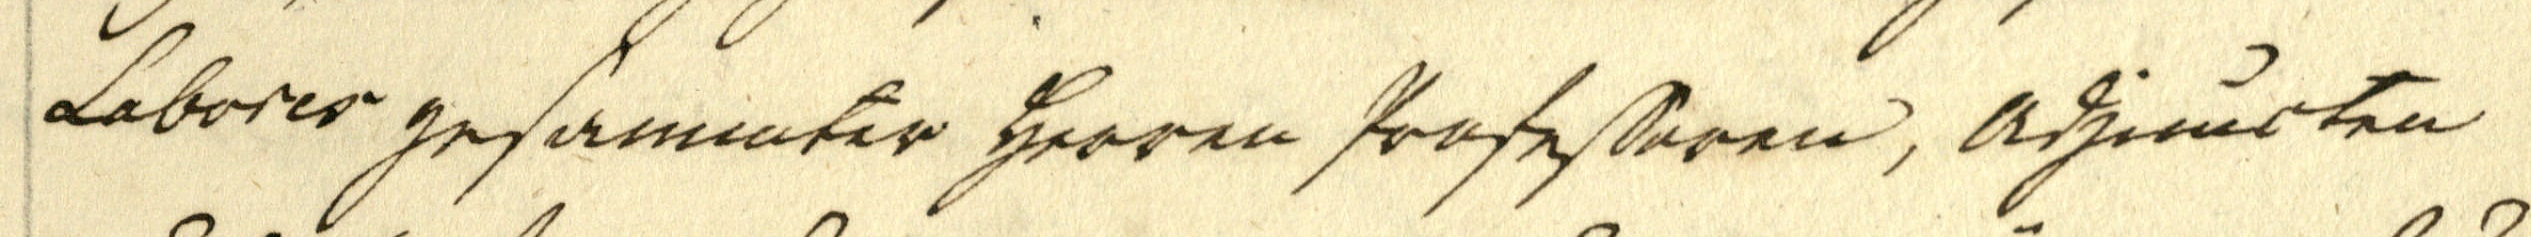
Labores gesammter Herren Professoren, Adjuncten
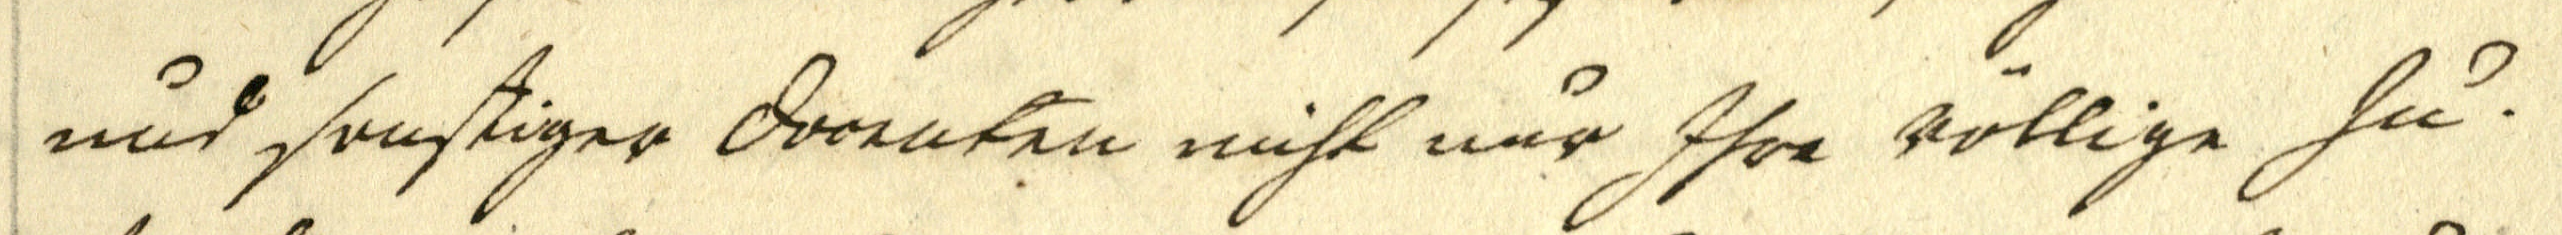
und sonstiger Docenten nicht nur Ihre völlige Zu¬
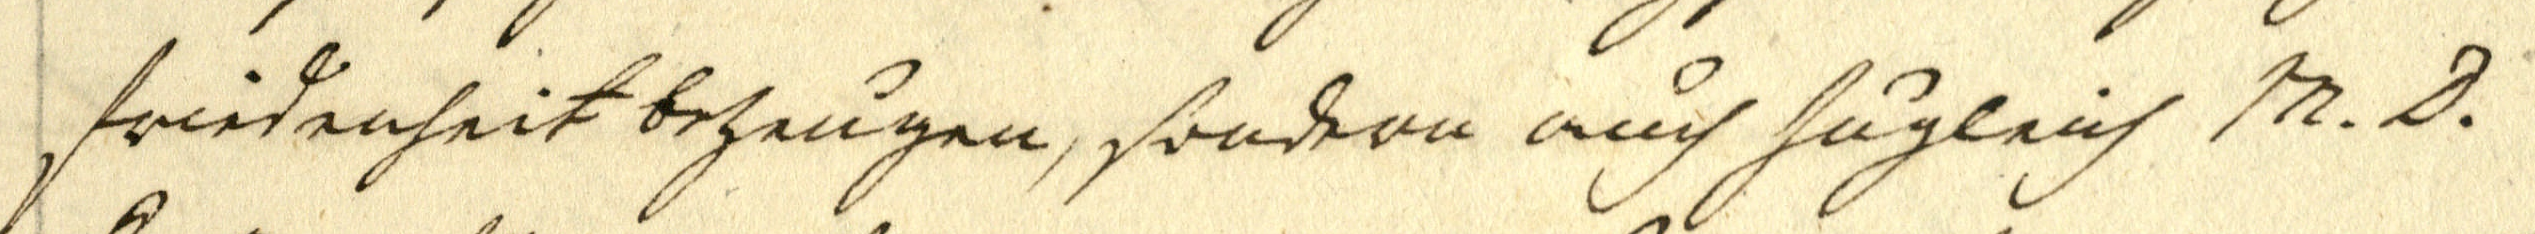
friedenheit bezeugen, sondern auch zugleich M. D.
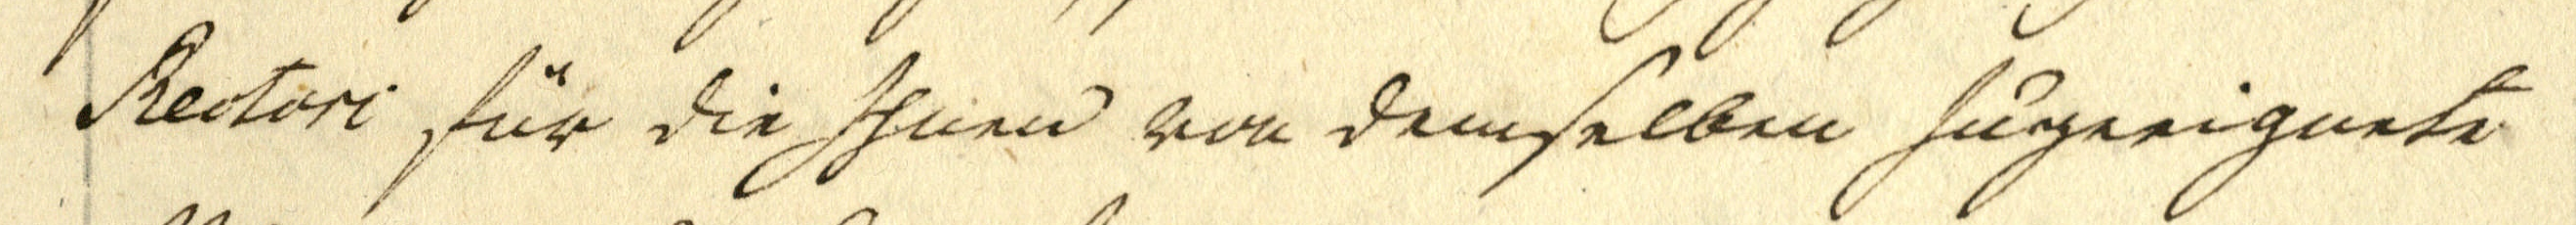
Rectori für die Ihnen von demselben zugeeignete
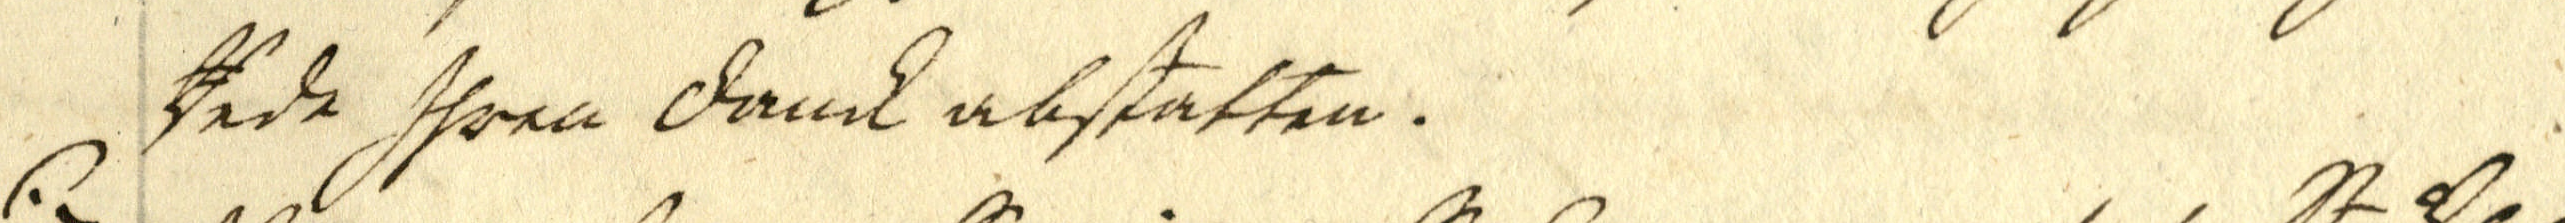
Rede Ihren Danck abstatten.
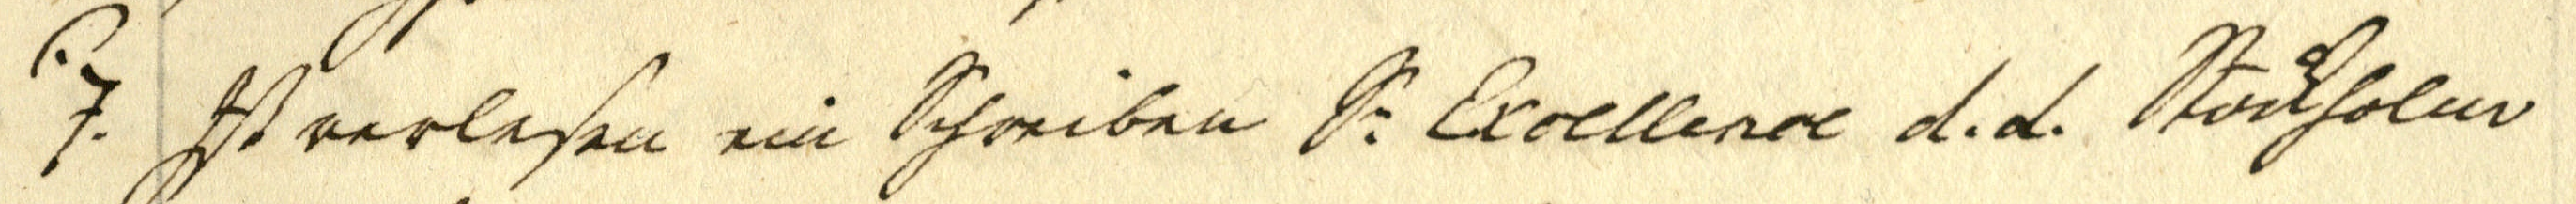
7. Ist verlesen ein Schreiben Sr. Excellence d.d. Stockholm
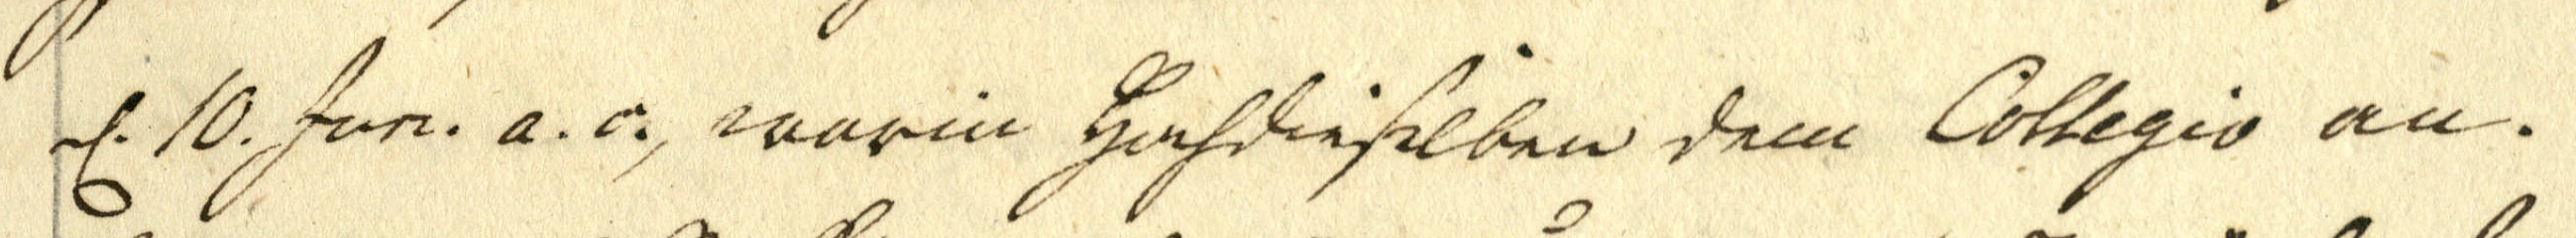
d. 10. Jun. a. c., worin Hochdieselben dem Collegio an¬
